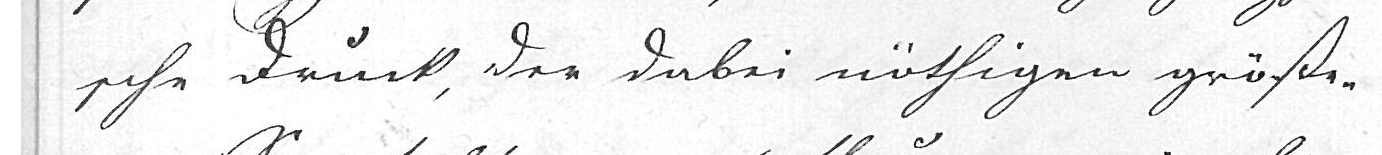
sche Druck, der dabei nöthigen größe-
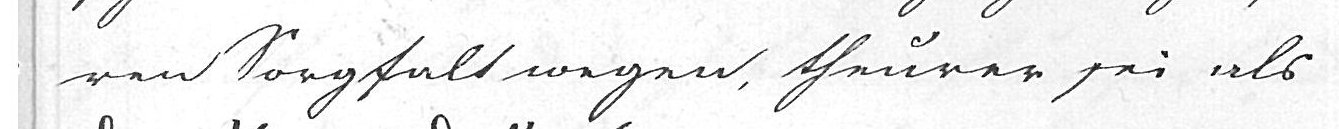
ren Sorgfalt wegen, theurer sei als
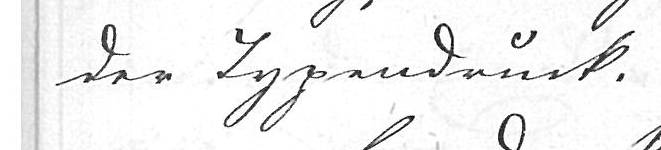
der Typendruck.
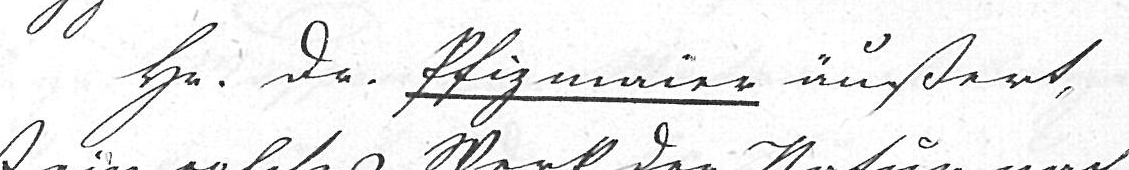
Hr. Dr. Pfizmaier äußert,
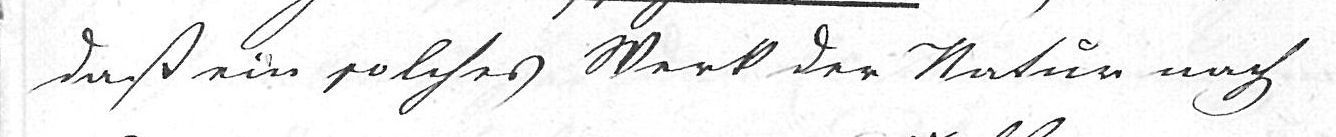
daß ein solches Werk der Natur nach
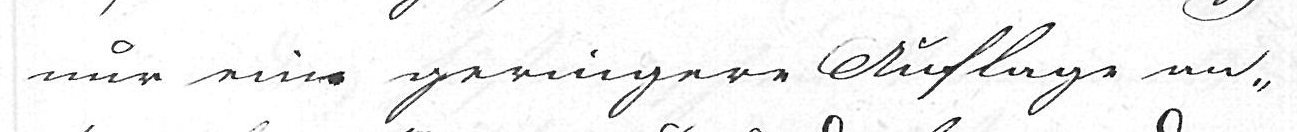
nur eine geringere Auflage an-
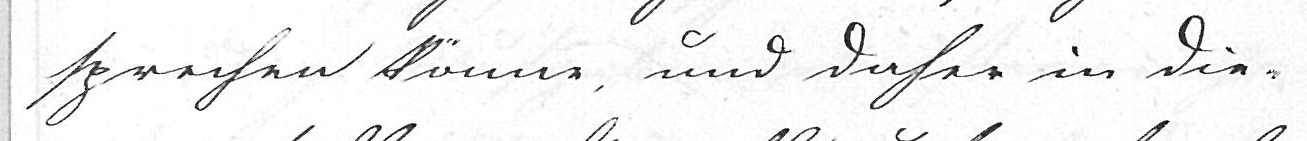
sprechen könne, und daher in die-
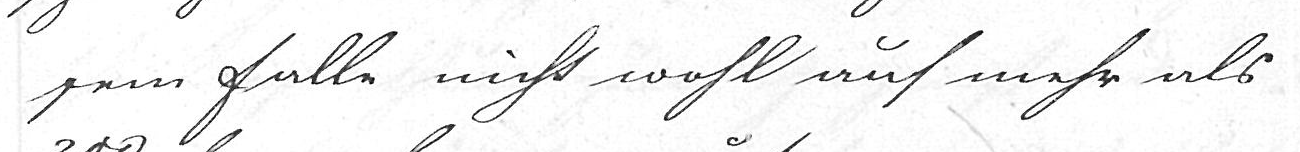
sem Falle nicht wohl auf mehr als
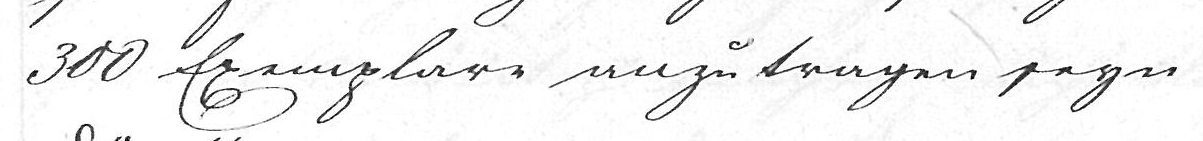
300 Exemplare anzutragen seyn
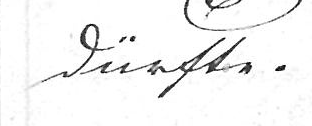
dürfte.
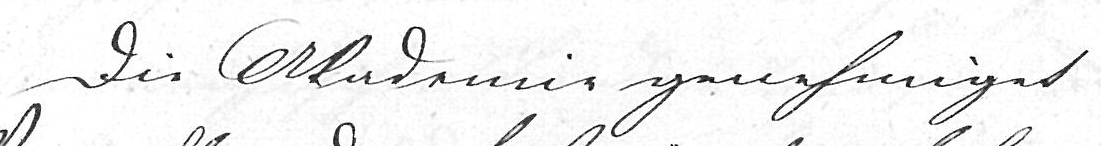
Die Akademie genehmiget
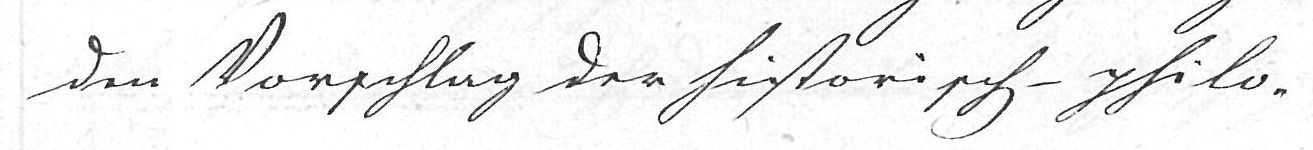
den Vorschlag der historisch-philo-
